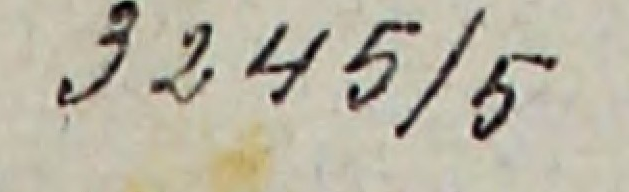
3245/5
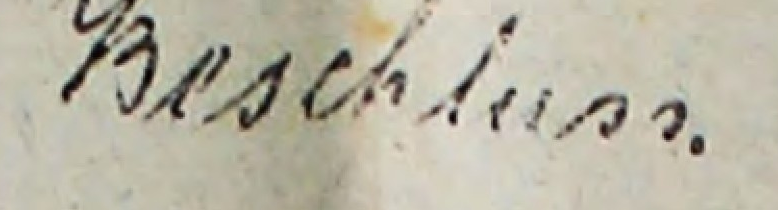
Beschluss.
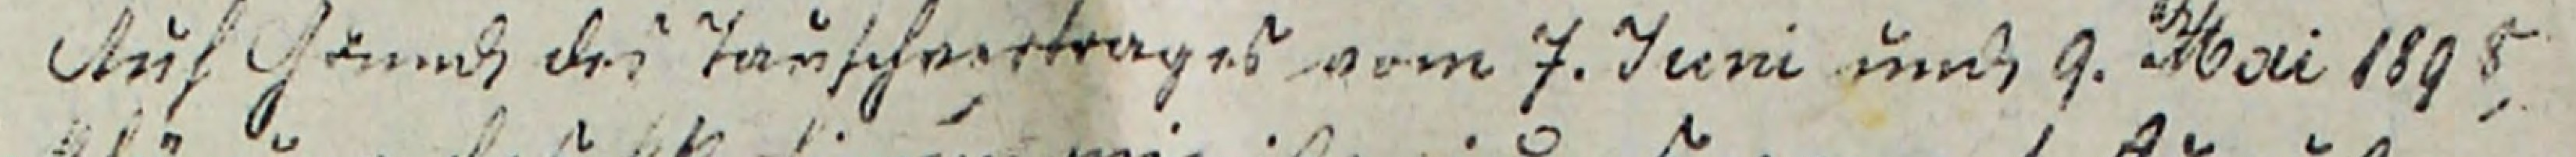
Auf Grund des Tauschvertrages vom 7. Juni und 9. Mai 1898
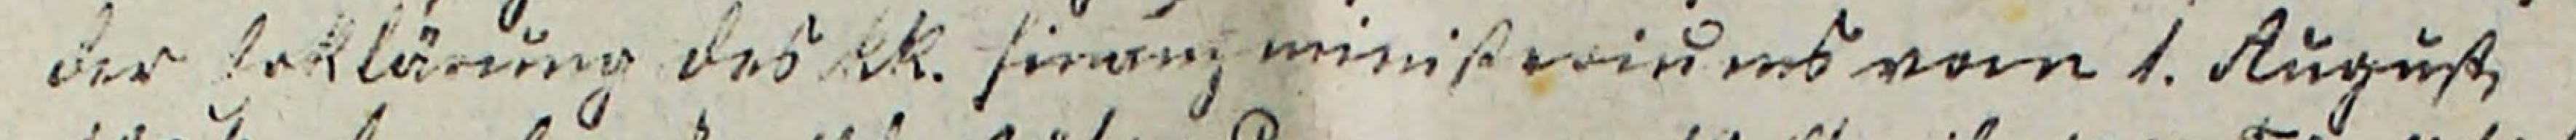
der Erklärung des kk. Finanzministeriums vom 1. August
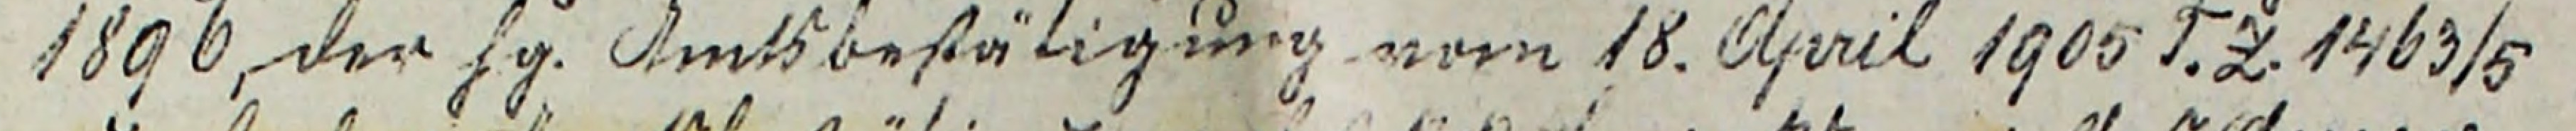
1896, der hg. Amtsbestätigung vom 18. April 1905. T.Z. 1463/5
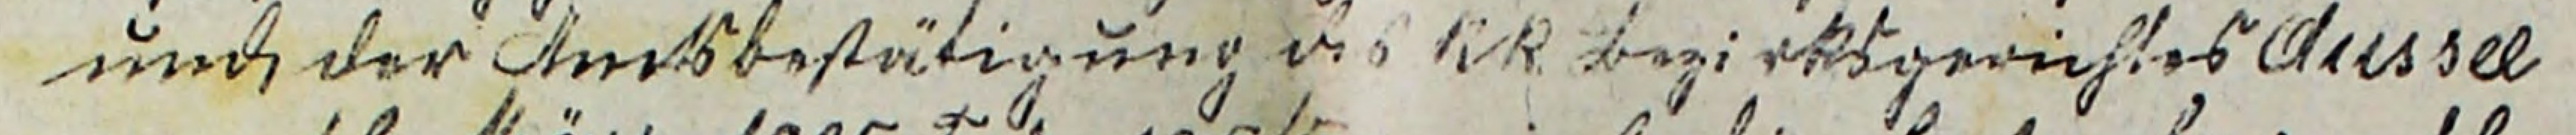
und der Amtsbestätigung des kk. Bezirksgerichtes Aussee
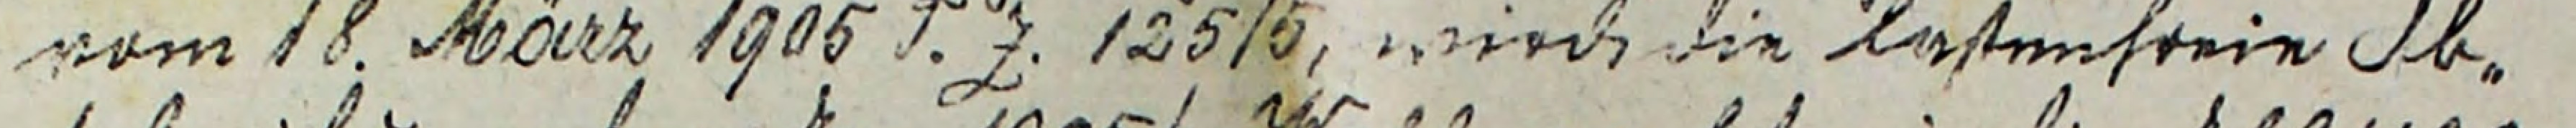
vom 18. März 1905 T.Z. 125/5, wird die lastenfreie Ab„
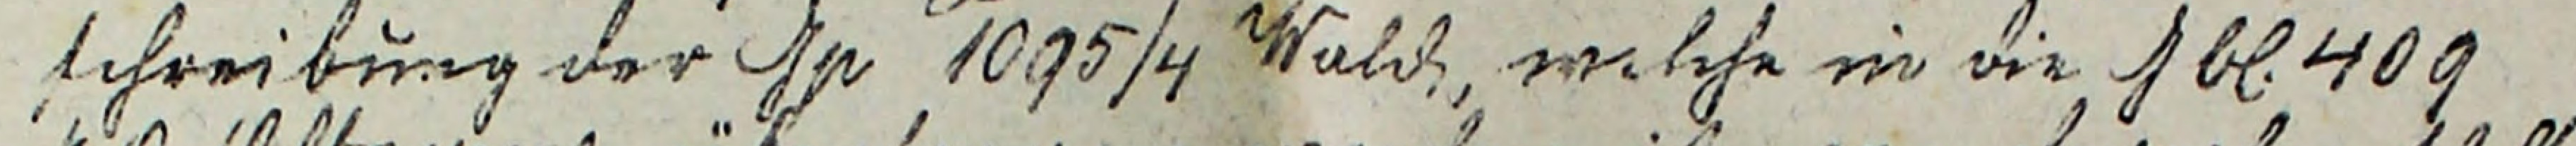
schreibung der Gp 1095/4 Wald, welche in die Gbl. 409
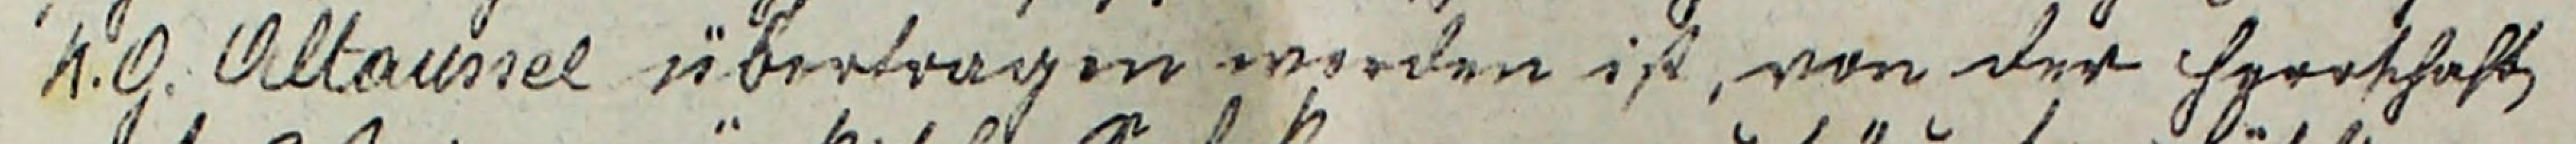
N.G. Altaussee übertragen werden ist, von der Herrschaft
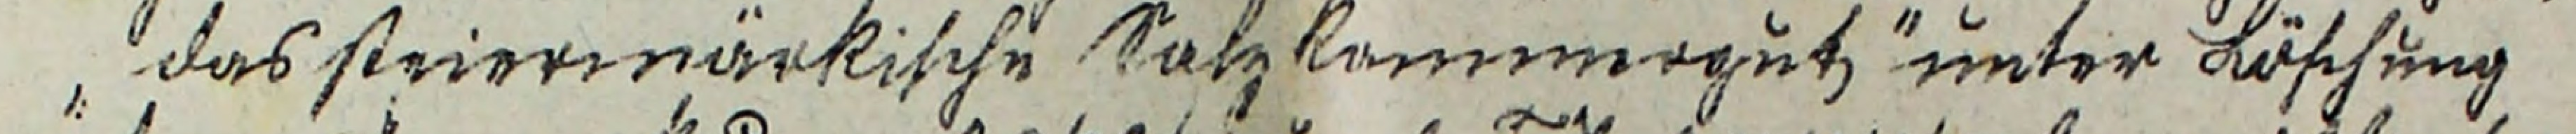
„Das steiermärkische Salz Kammergut“ unter Löschung
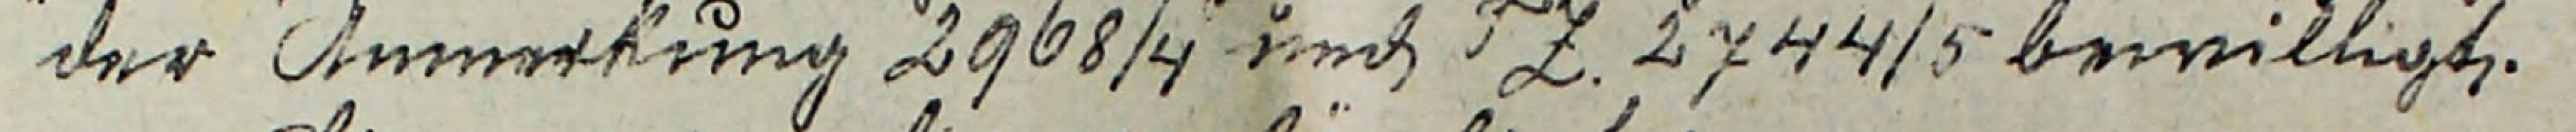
der Anmerkung 2968/4 und TZ. 2744/5 bewilligt.
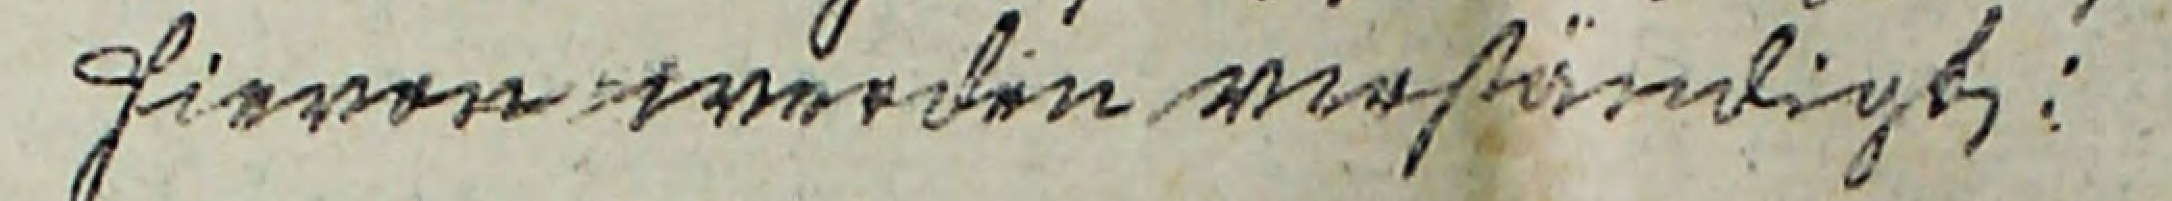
Hiervon werden verständigt:
